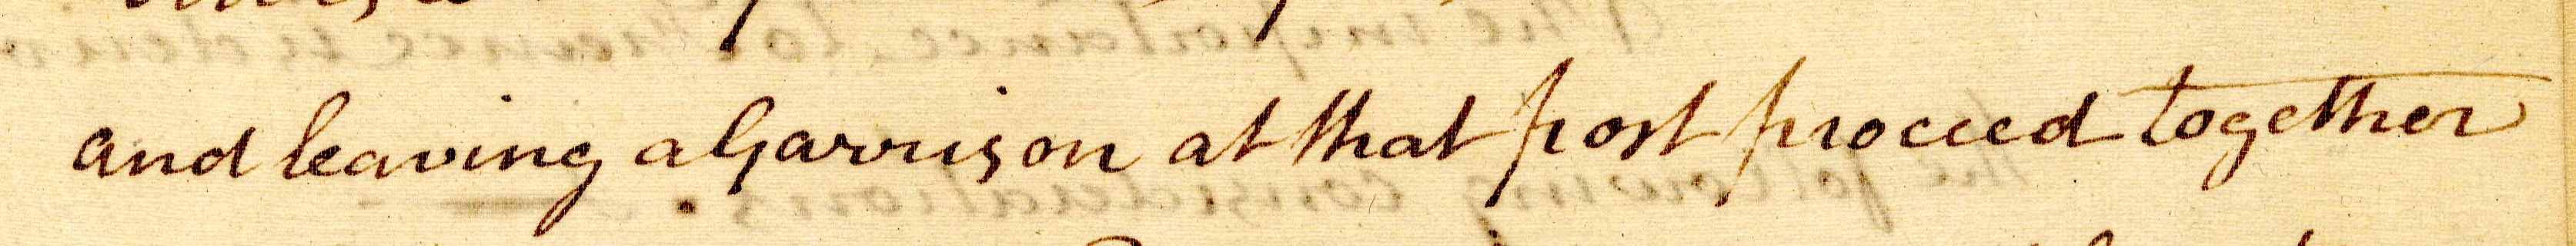and leaving a Garrison at that post proceed together
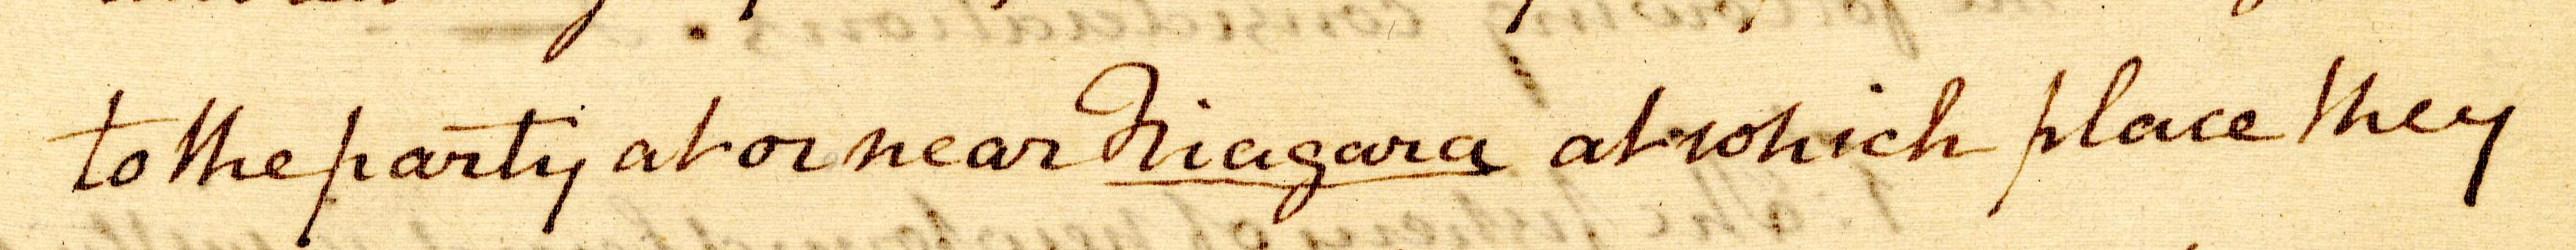to the party at or near Niagara at which place they
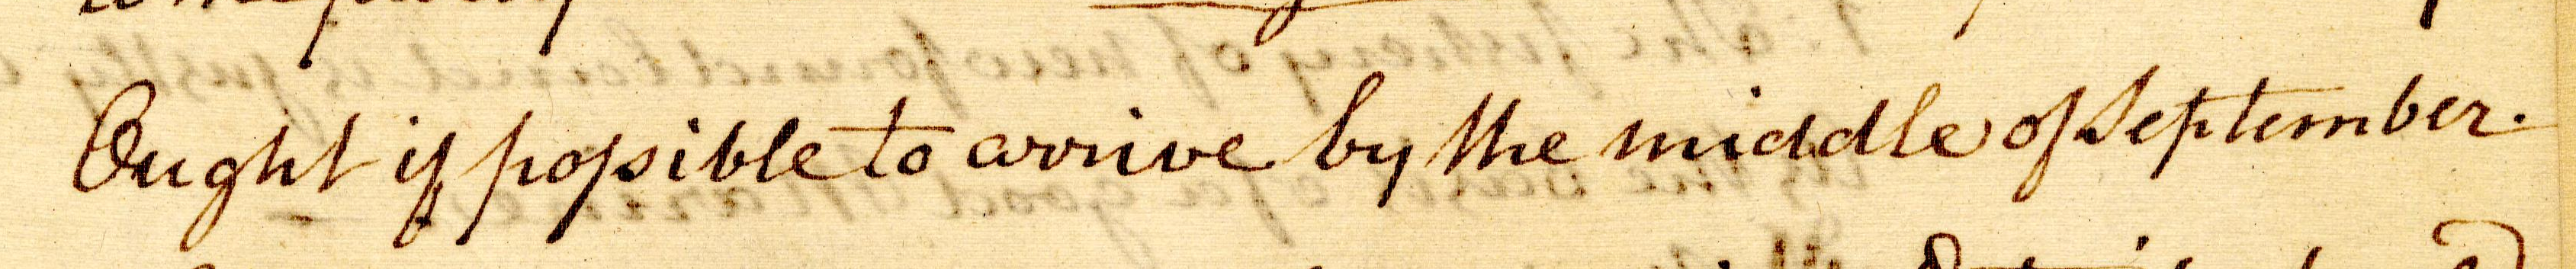Ought if possible to arrive by the middle of September.
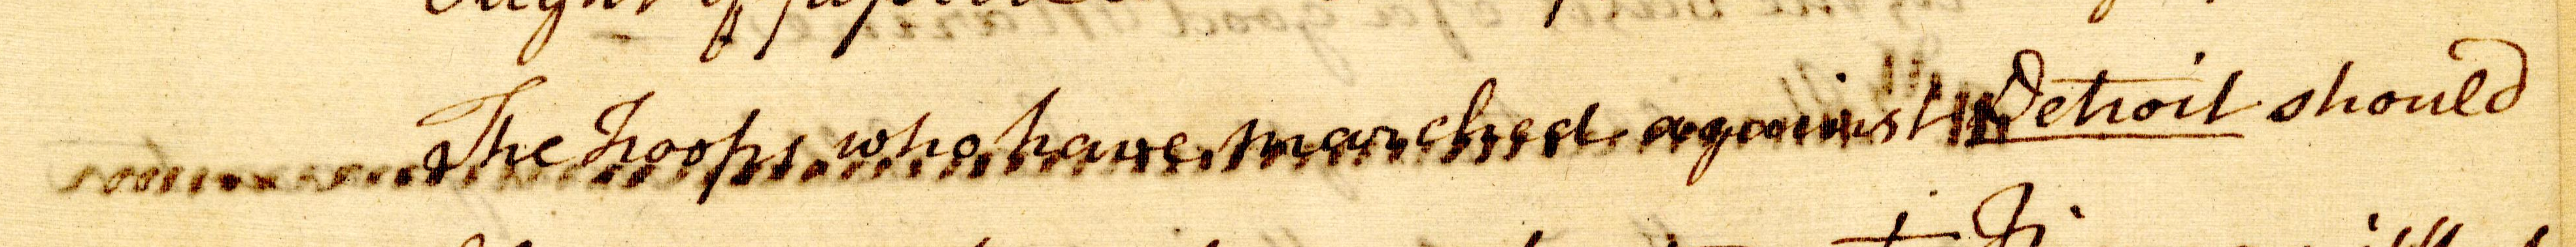The Troops who have marched against Detroit should
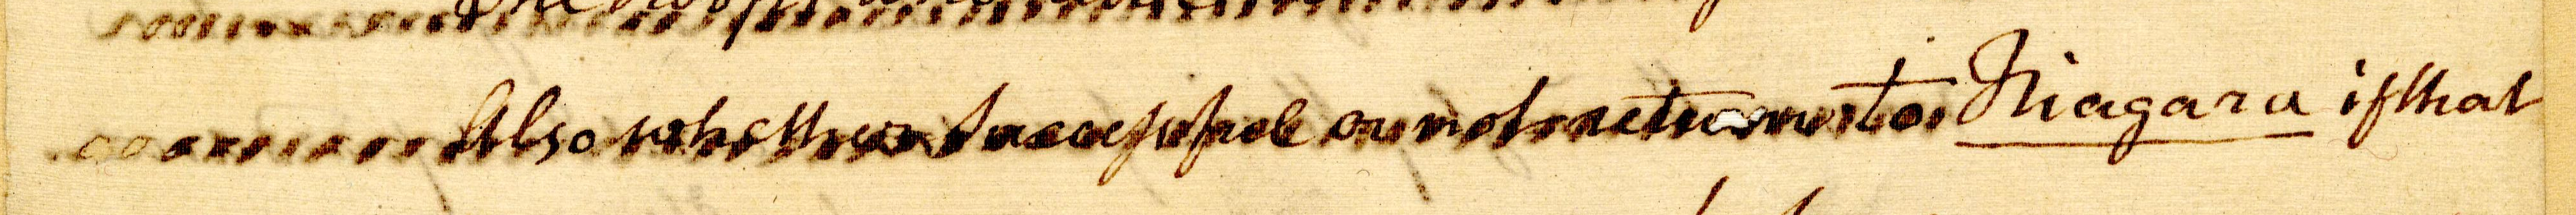also whether successful or not retreat to Niagara if that
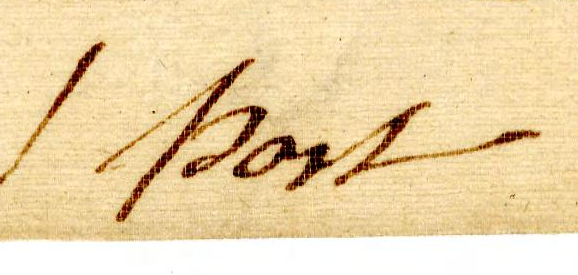Post
